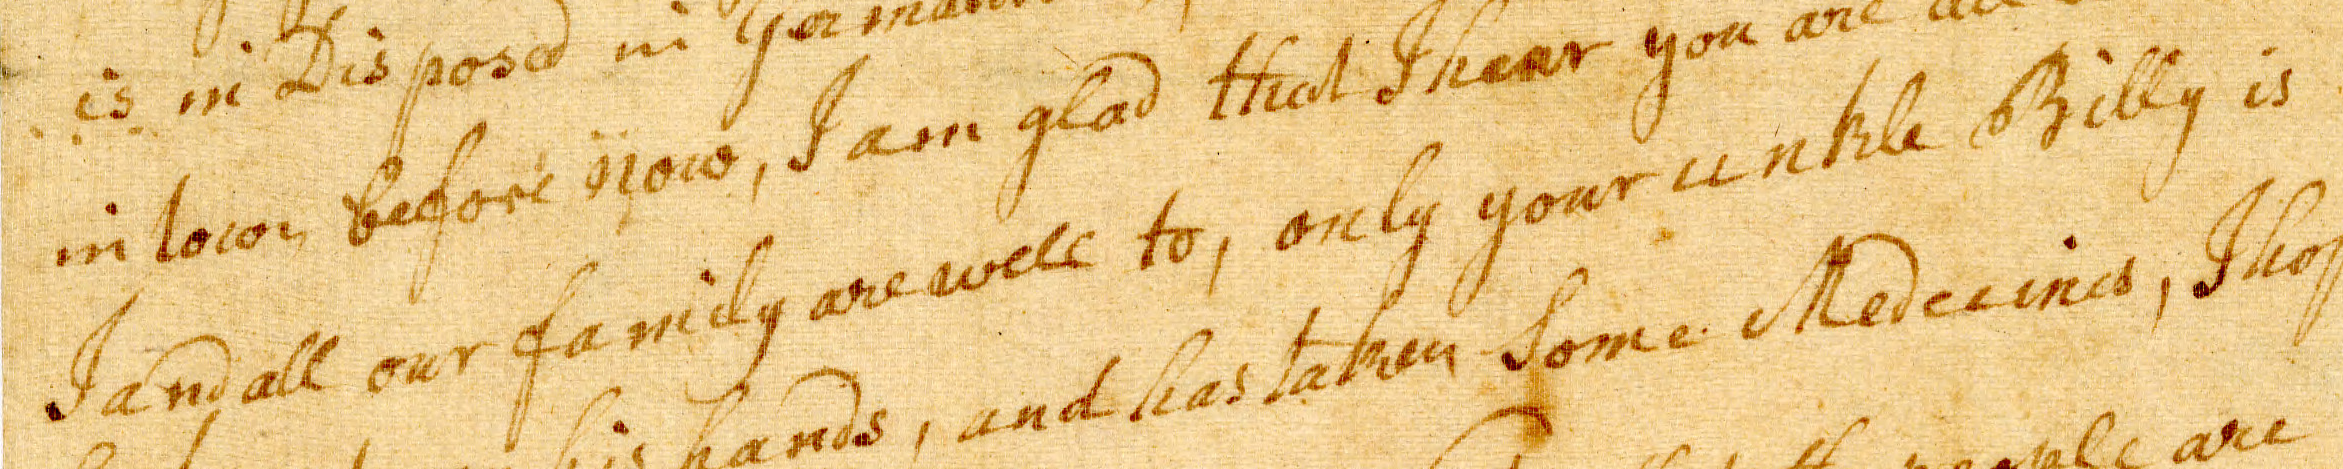I and all our family are well to, only your unkle Billy is
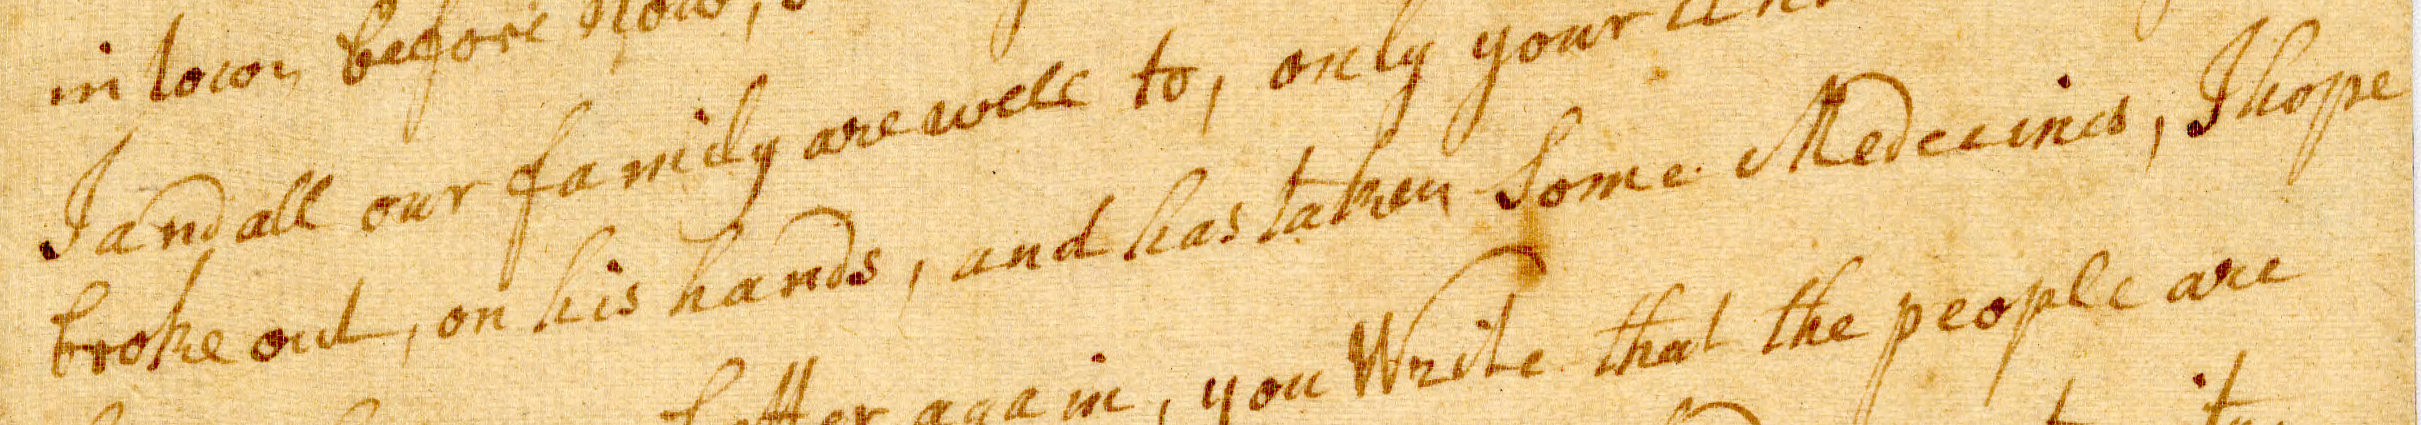broke out, on his hands, and has taken some Medecines, I hope
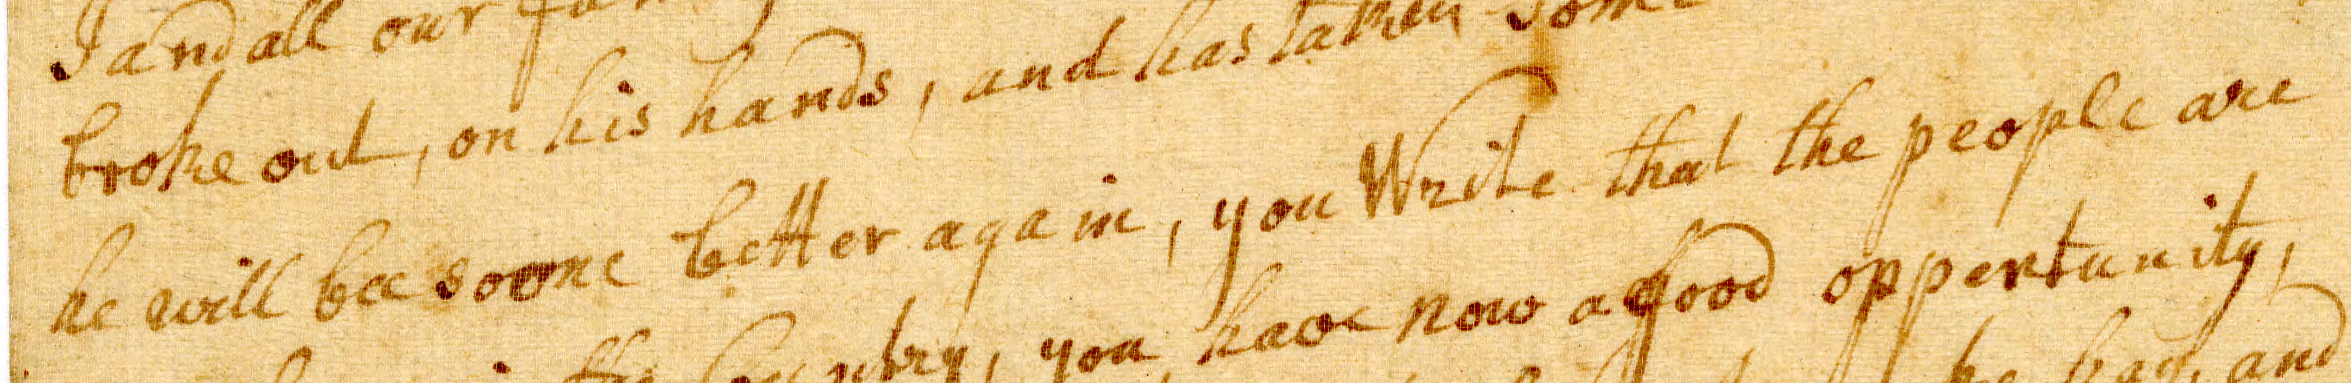he will bee soone better again, you Write that the people are
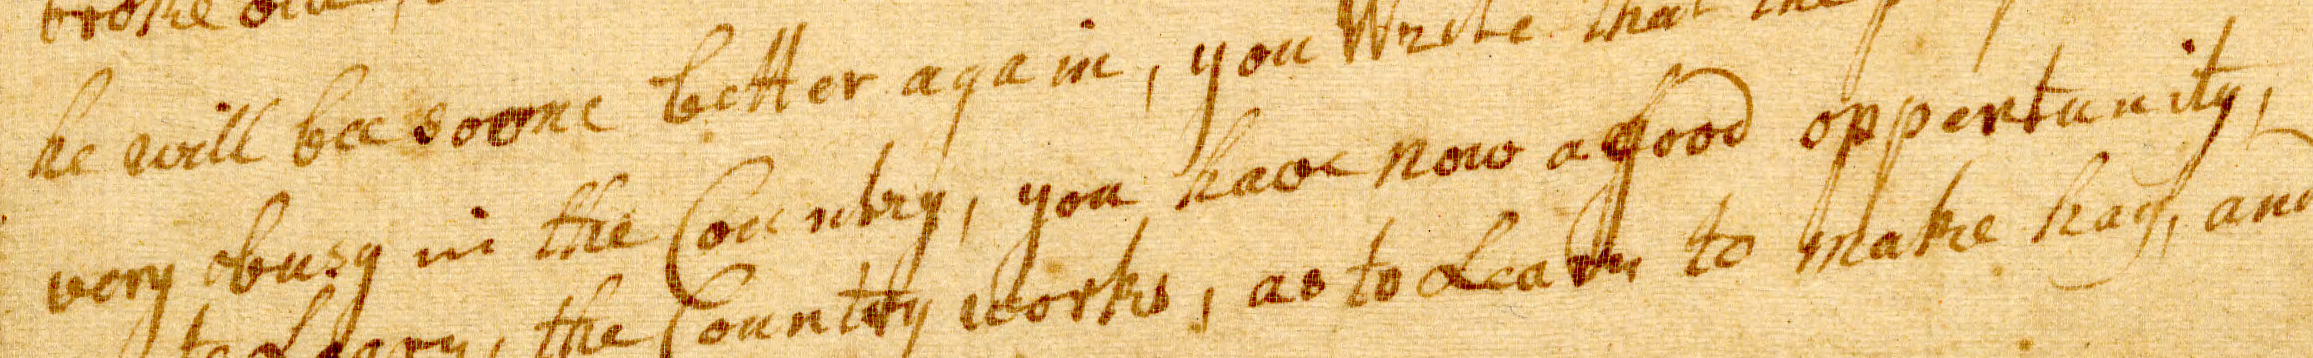very busy in the Country, you have now a good oppertunity,
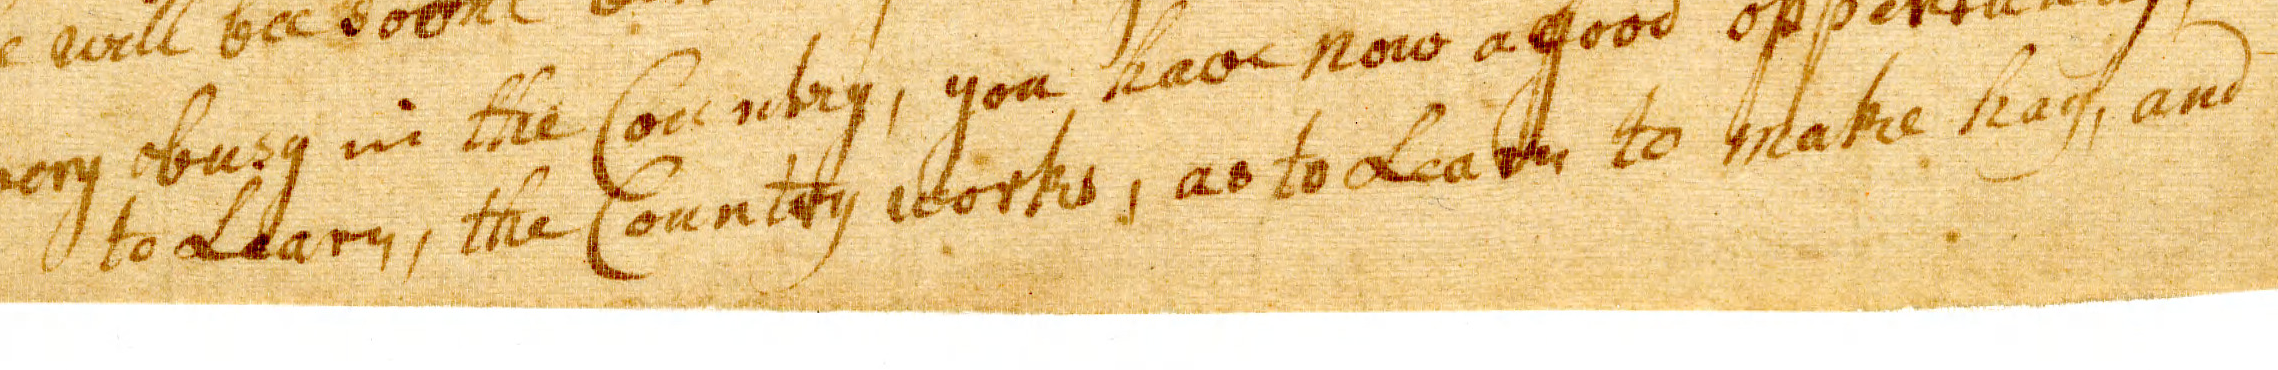to Learn, the Country works, as to Learn to make hay, and
